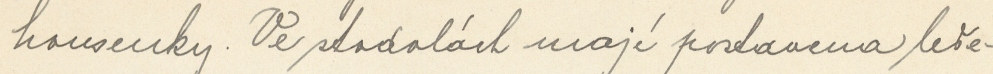housenky. Ve stodolách mají postavena leše-
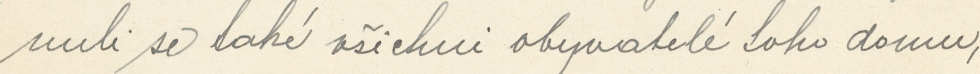nuli se také všichni obyvatelé toho domu,
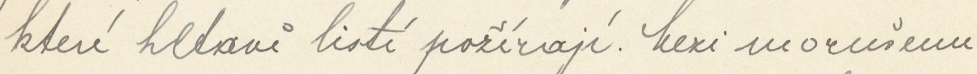které hltavě listí požírají. Mezi morušemi
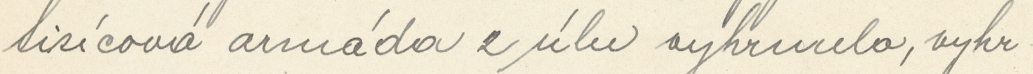tisícová armáda z úlu vyhrnula, vyhr-
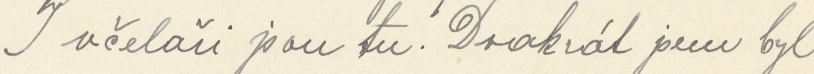I včelaři jsou tu. Dvakrát jsem byl
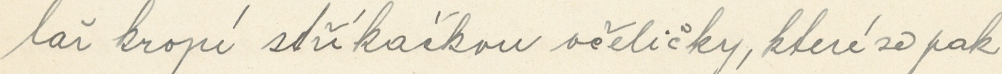lař kropí stříkačkou včeličky, které se pak
